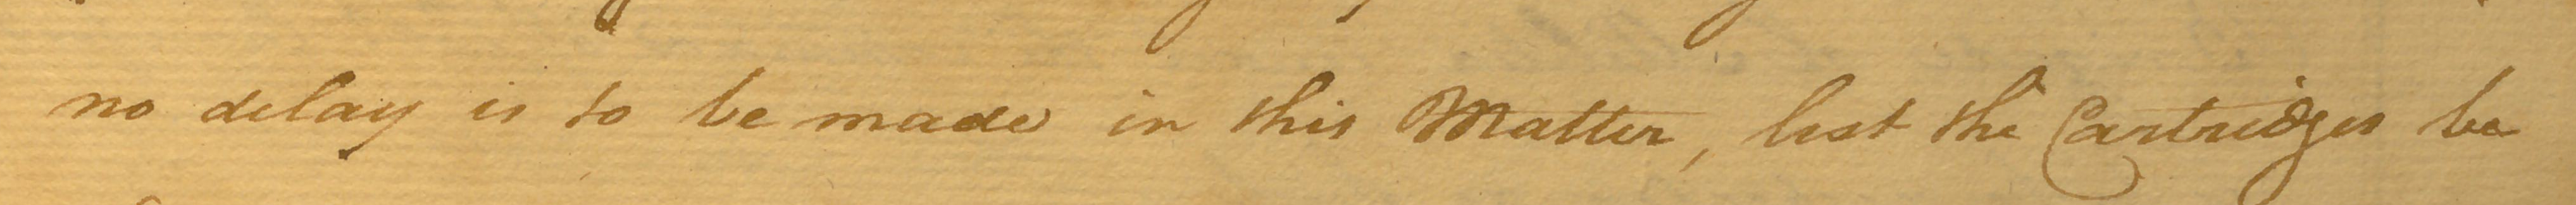no delay is to be made in this Matter, lest the Cartridges be
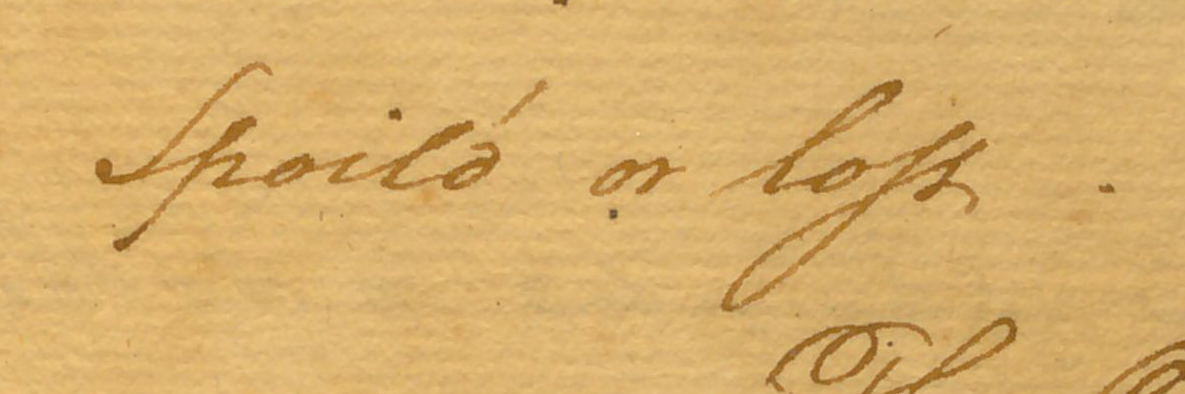spoil'd or lost.
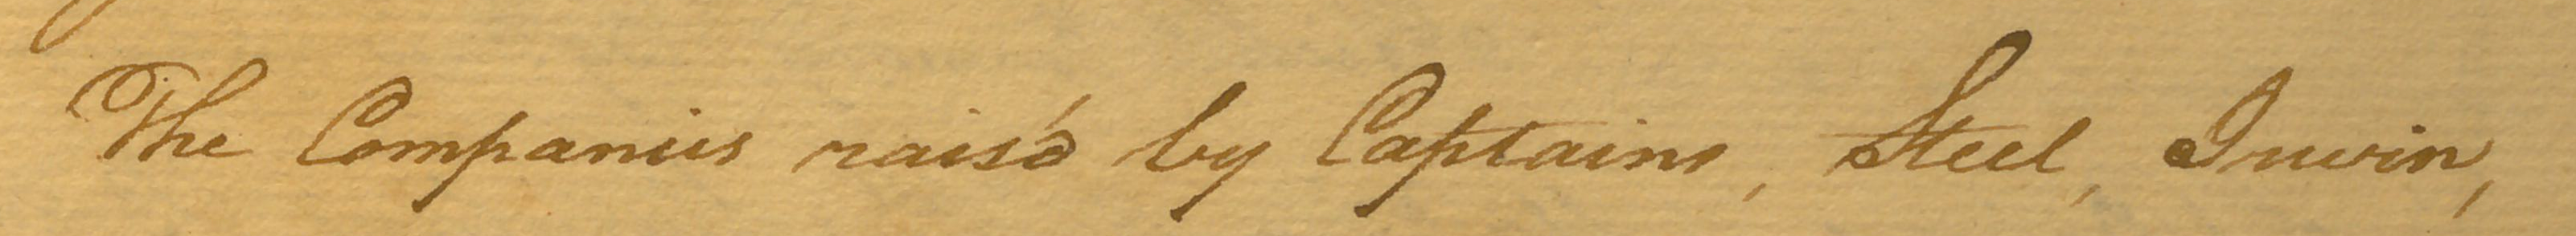The Companies rais'd by Captains, Steel, Irwin,
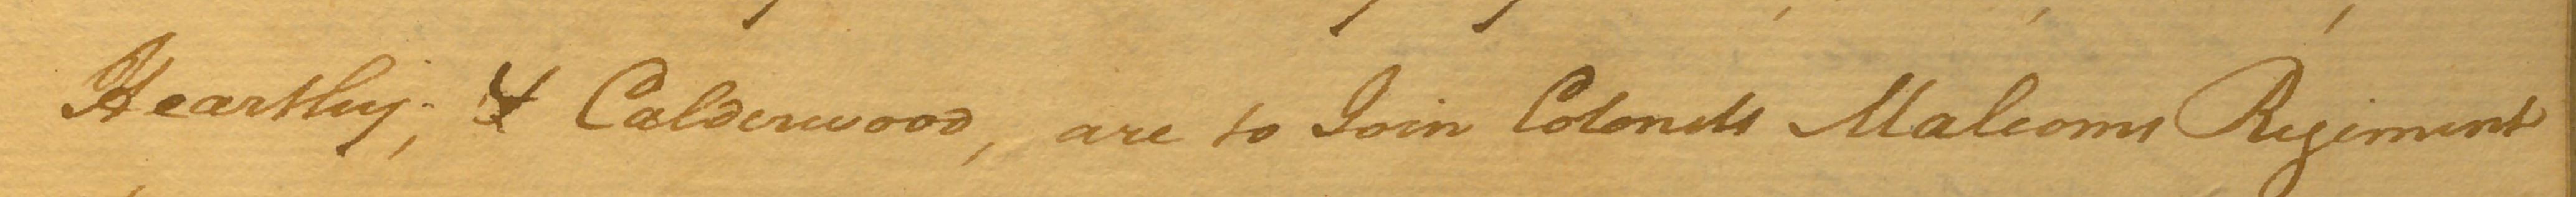Heartley; & Calderwood, are to Join Colonell Malcoms Regiment
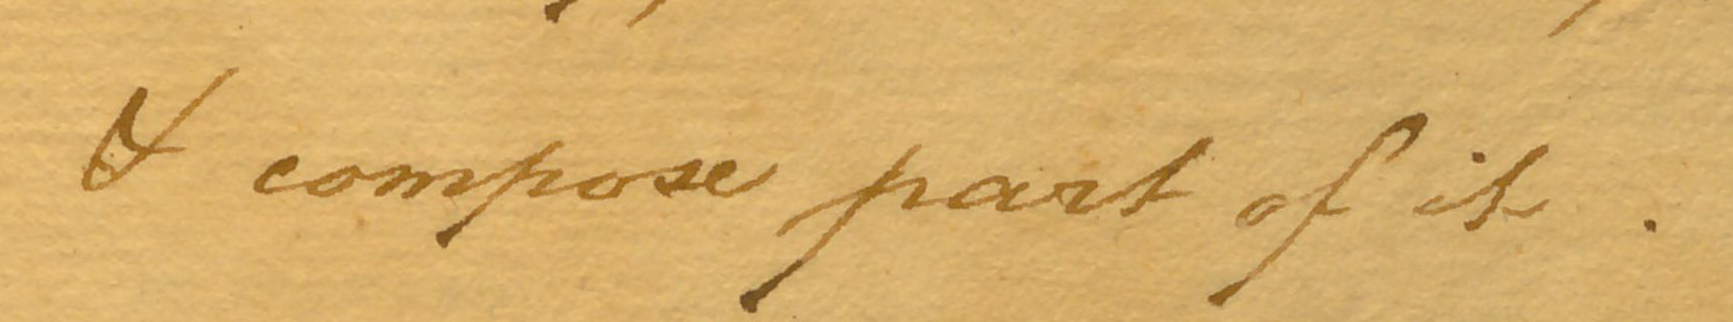& compose part of it.
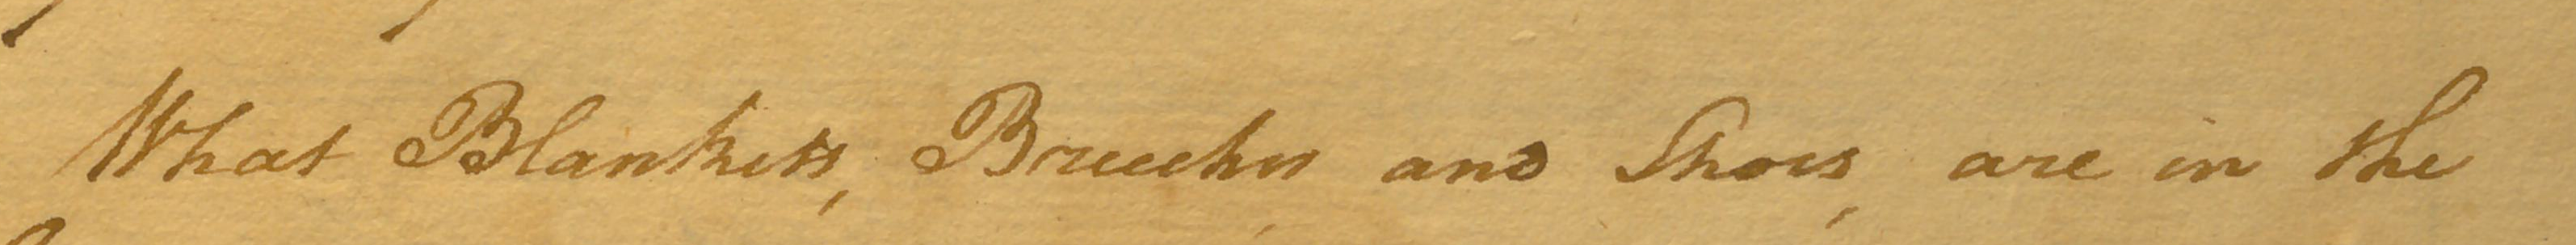What Blankets, Breeches and Shoes are in the
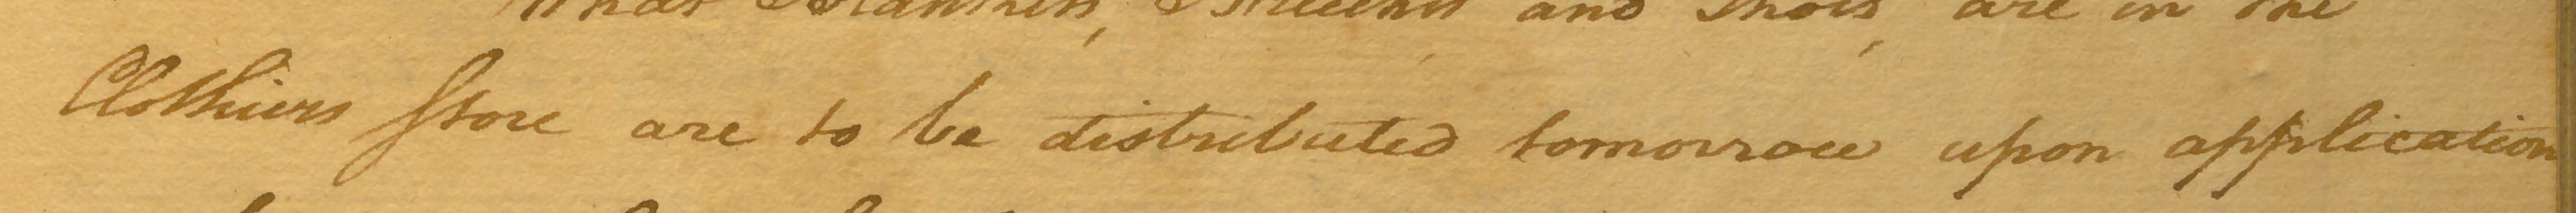Clothiers store are to be distributed tomorrow upon application
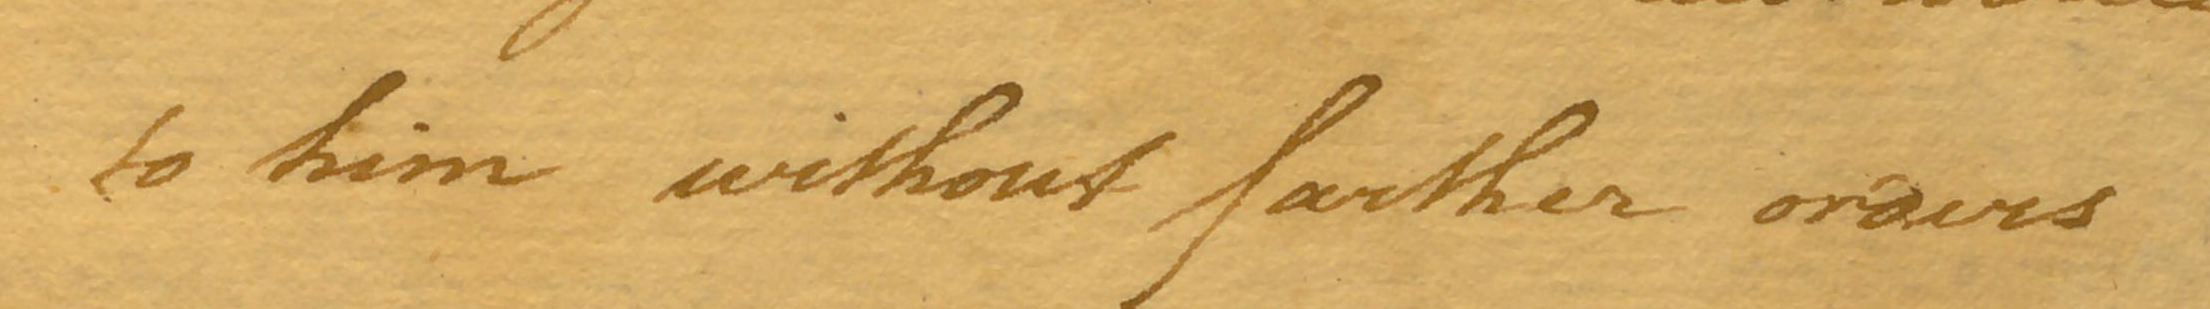to him without farther orders
